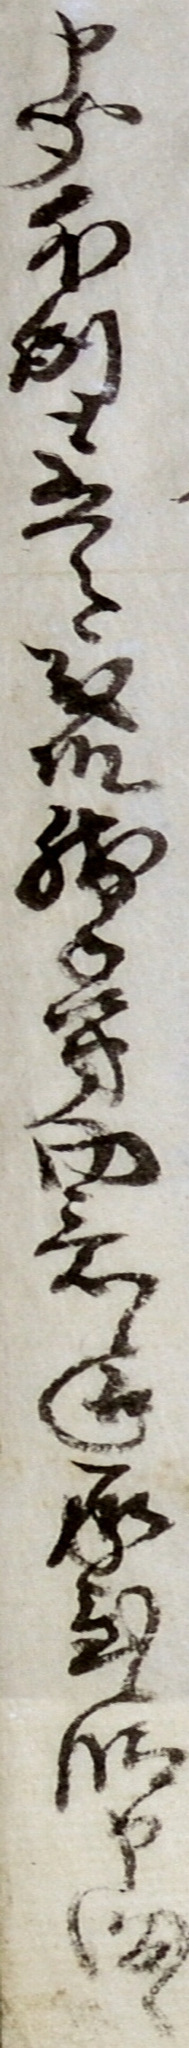申聞外例も有之義故勝手次第内意之通承置候段申渡候

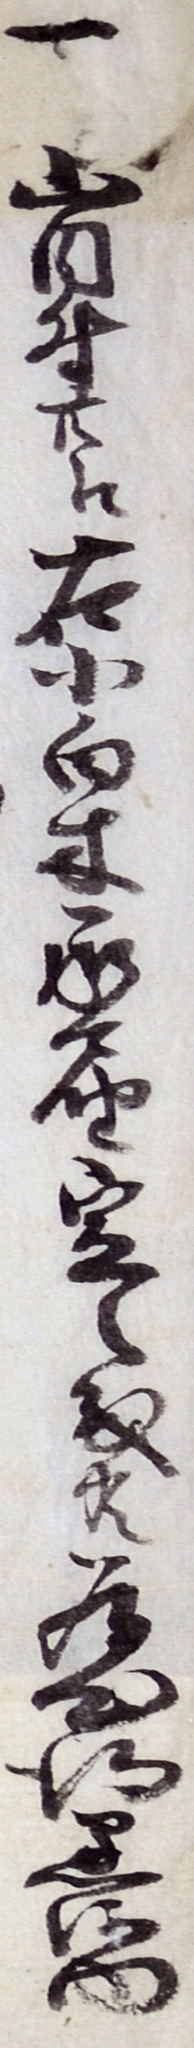一山目付共江右白木承届定之義共為心得黒河内
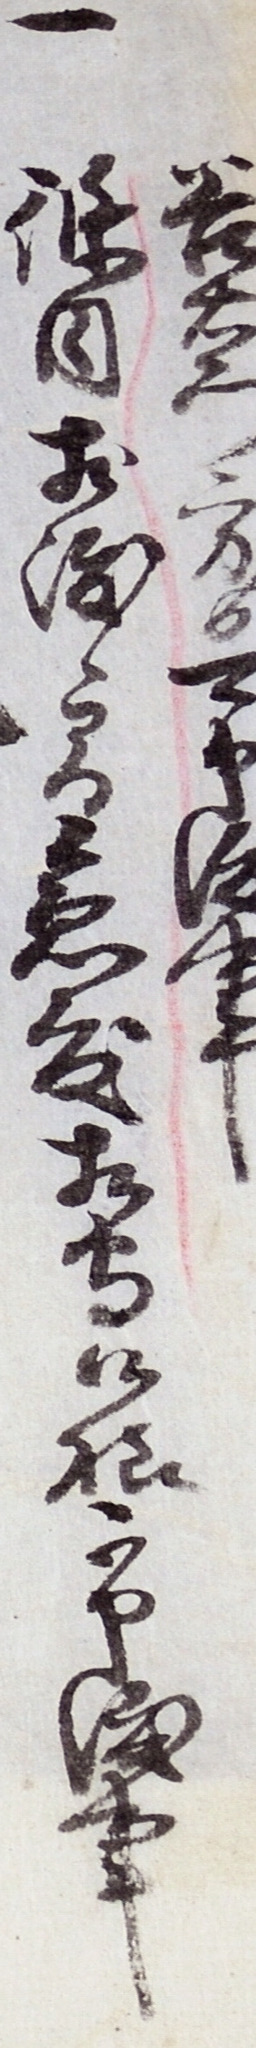一條目相渡候間急度相守候様可申渡事
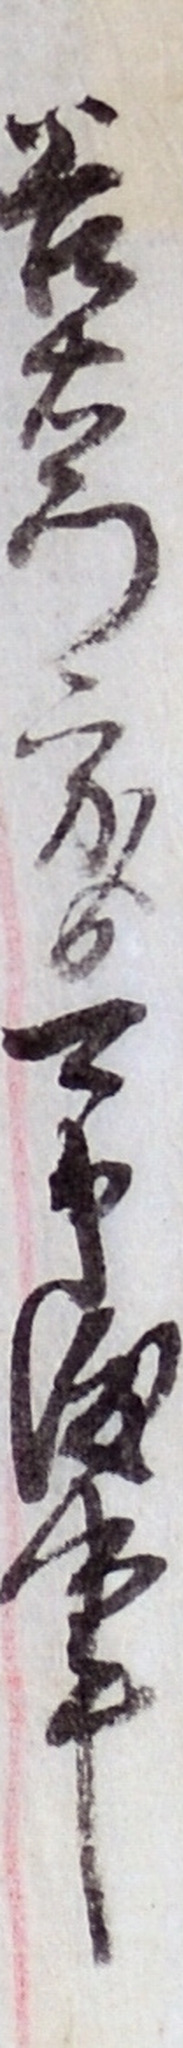善右衛門方ゟ可申渡事
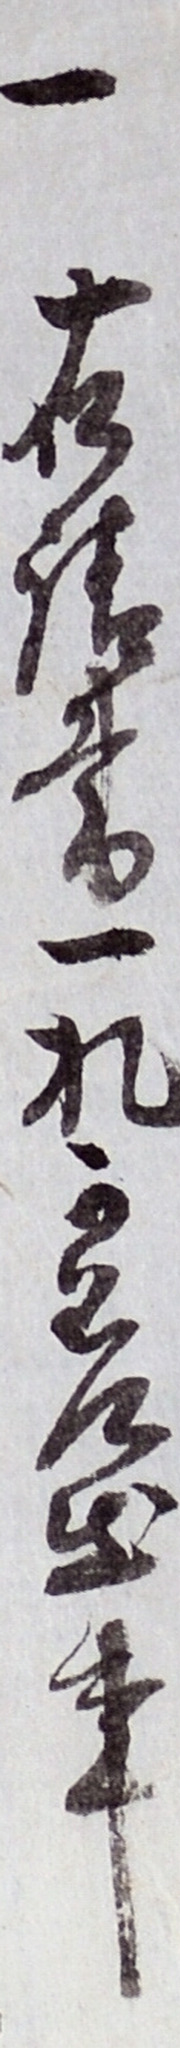一右請書一札可差出事
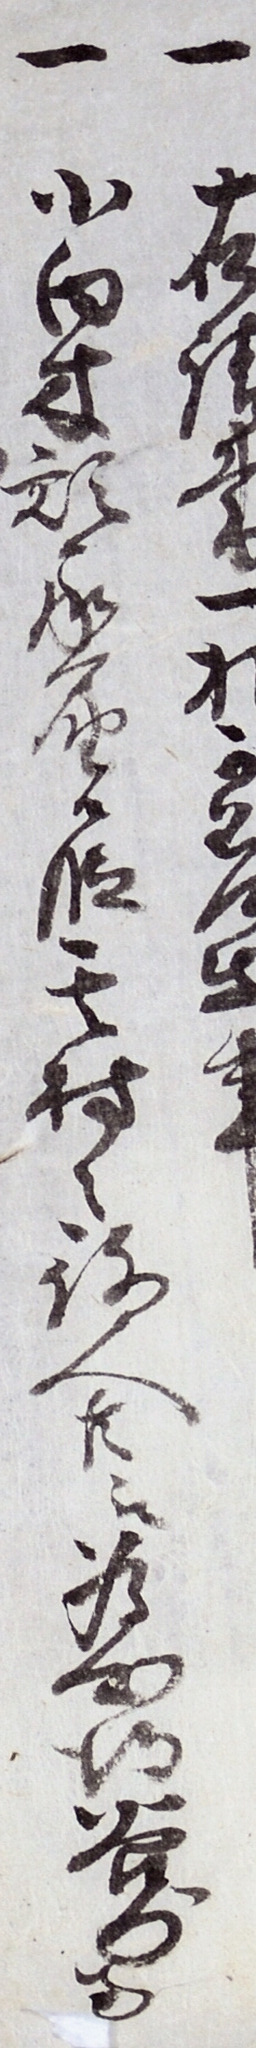一小白木願承届候段其村々役人共江為心得善右衛門方
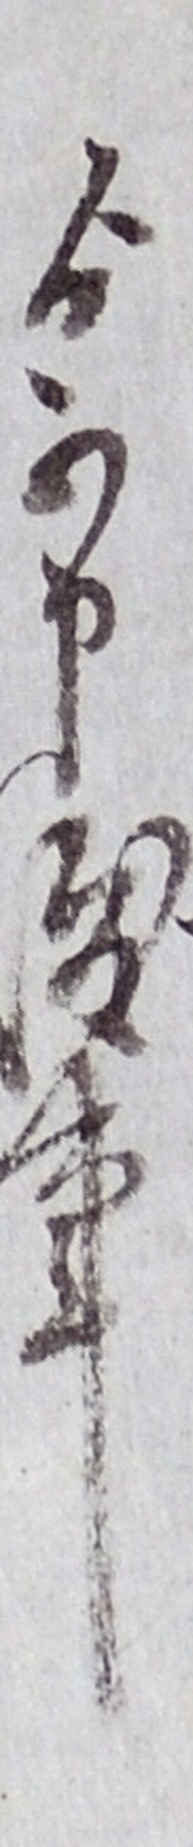ゟ可申渡事
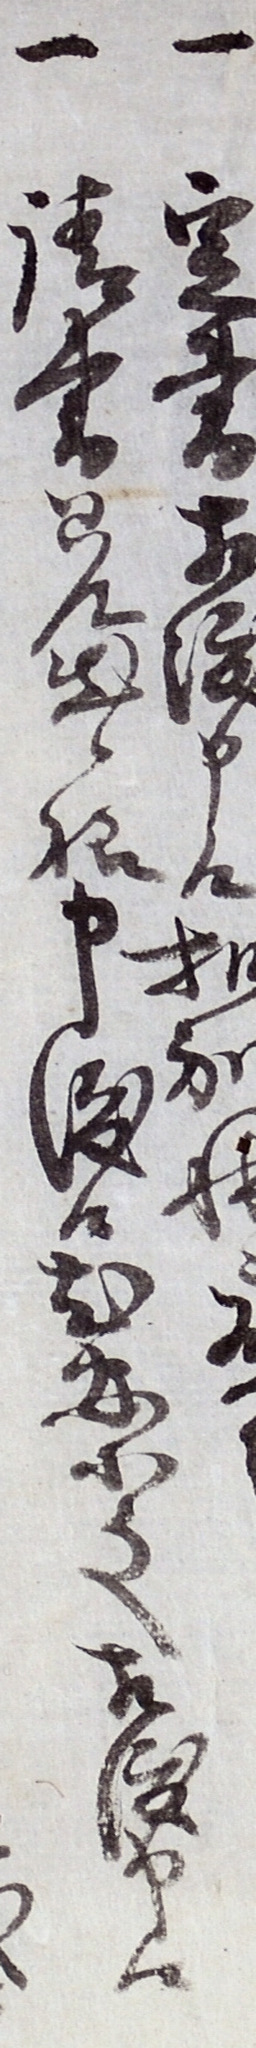一請書差出候様申渡候尤案文相渡申候
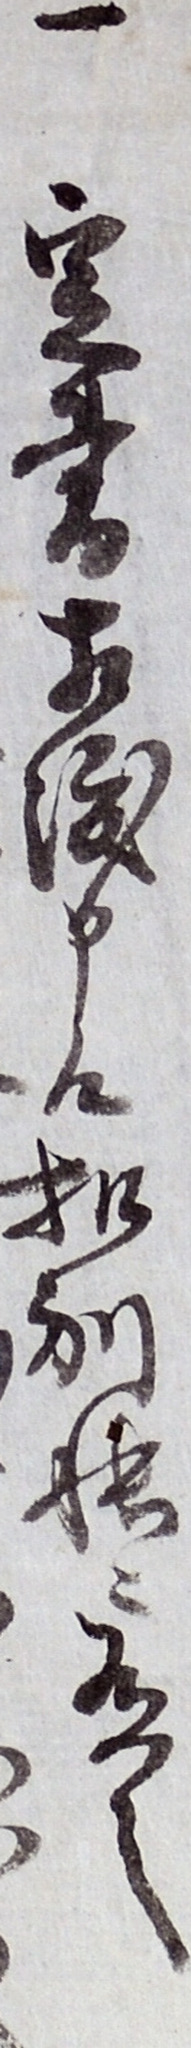一定書相渡申候扣別帳ニ有之
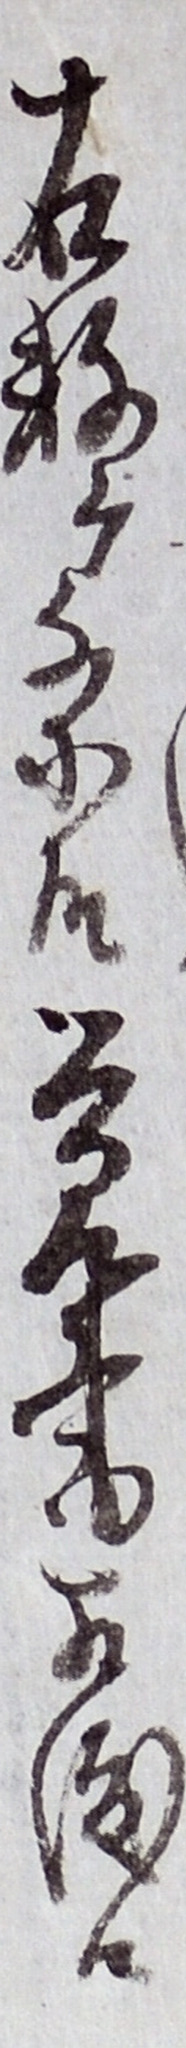右数ヶ条故覚書相渡候
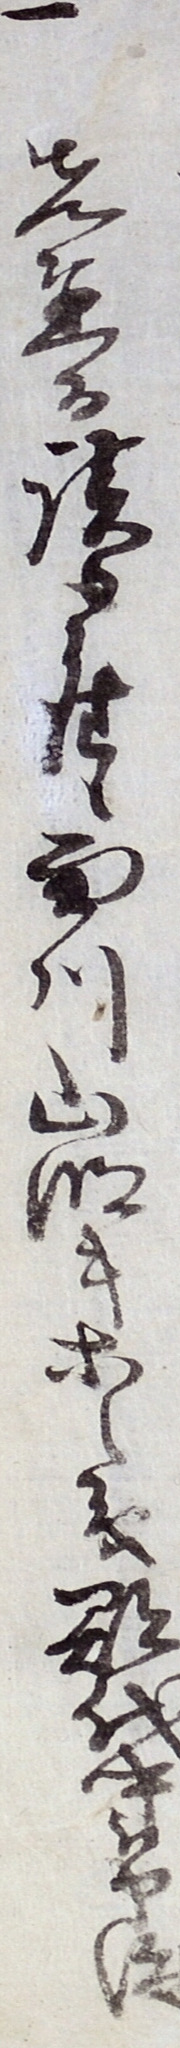一先達而請談御座候面川山明キ等之義郡代中江申渡
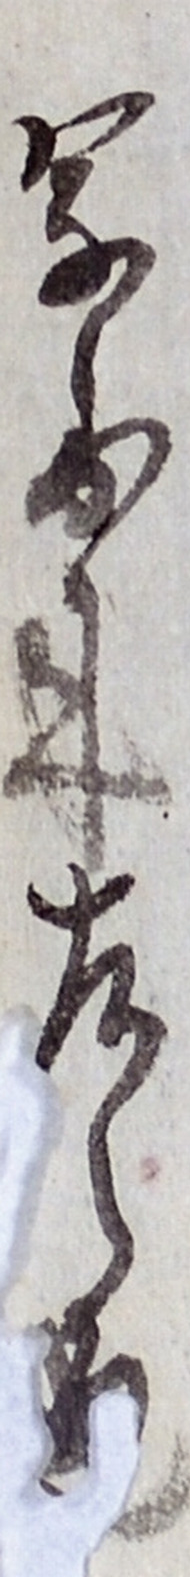写到来左之通
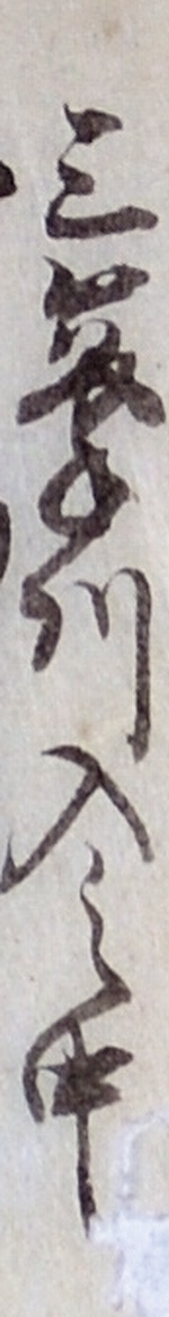三峯川入之中
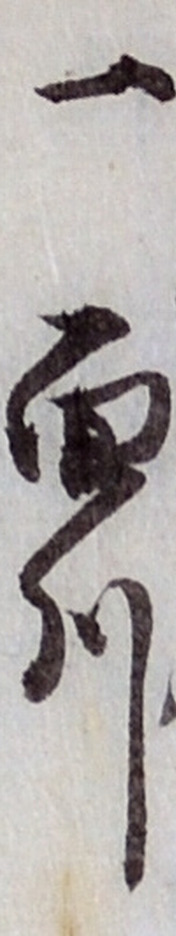一面川
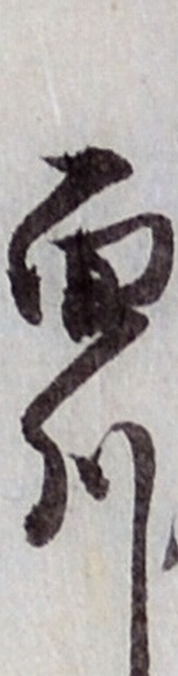一面川
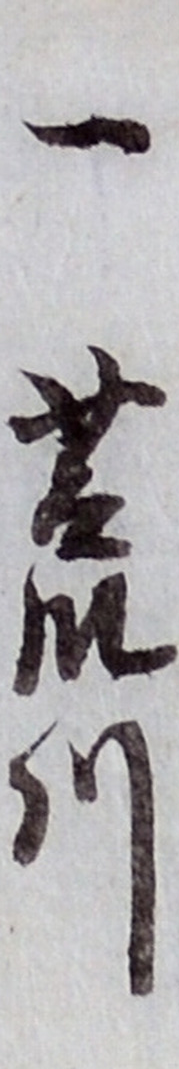一荒川
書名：御山奉行御用留
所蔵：伊那市立高遠町図書館・合同会社AMANE
